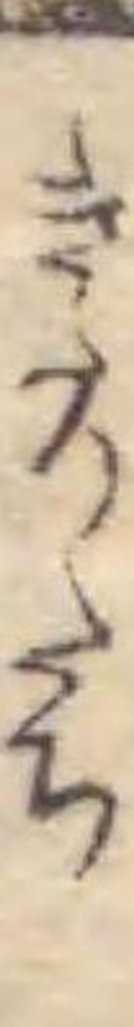きたりたち
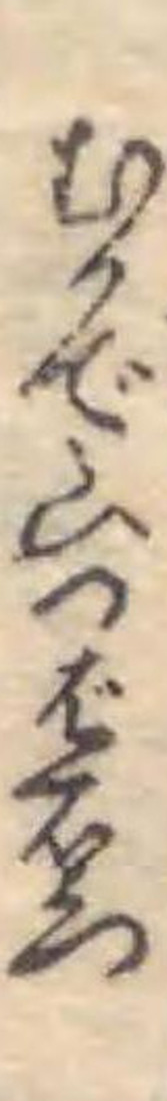むかで山つば右衛門
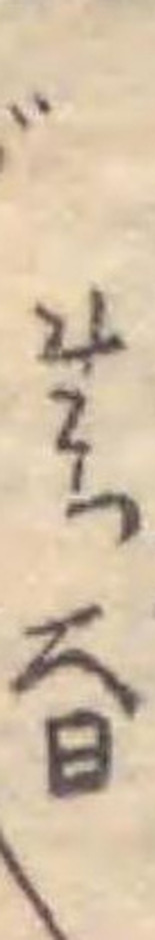まち大日
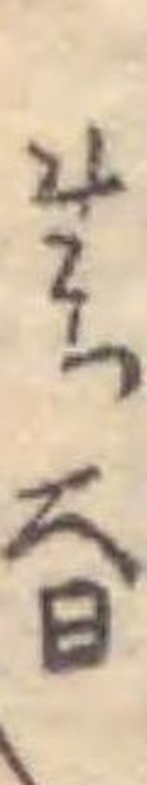まち大日
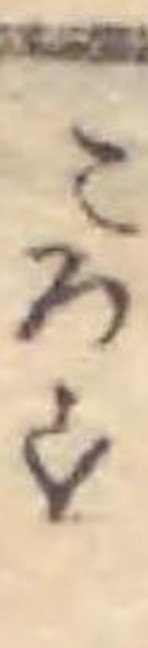ころす
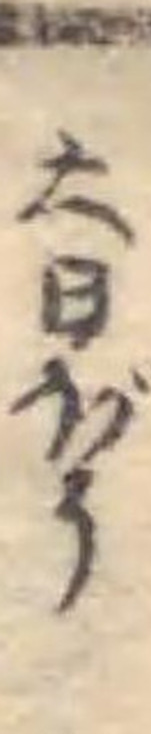大日ぼう
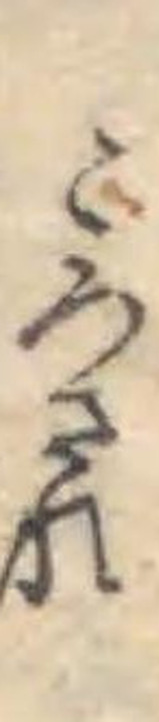ころされ
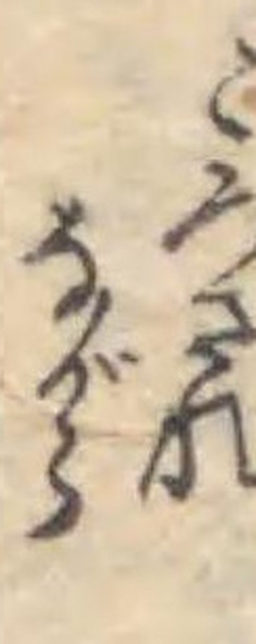ながら
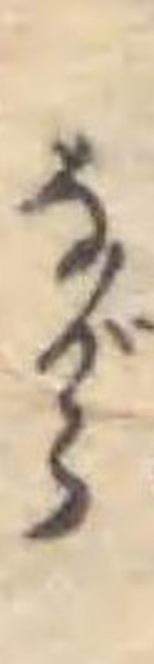ながら
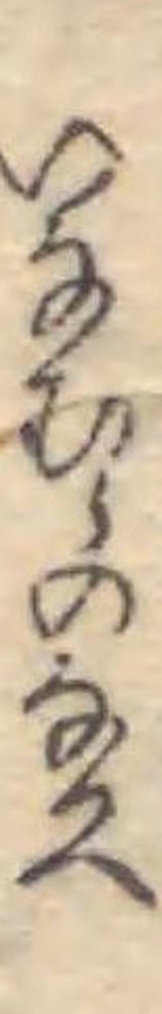いなむらのなかへ
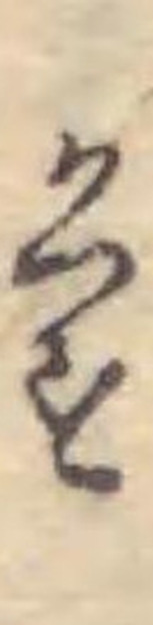はつす
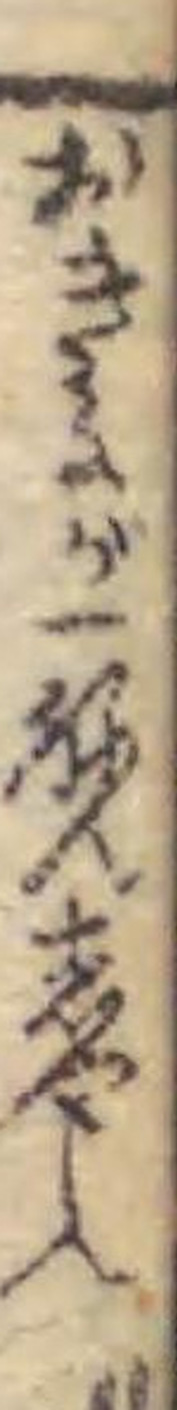おきよが一ねんしやしん
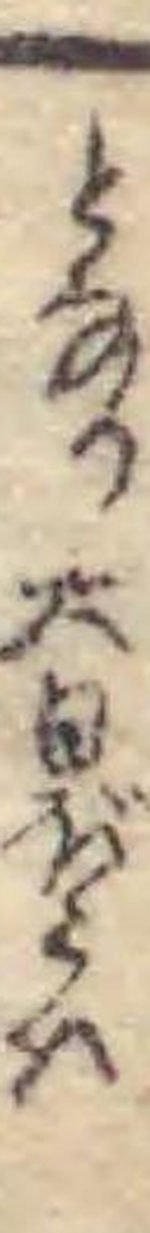となり大日ぼうは
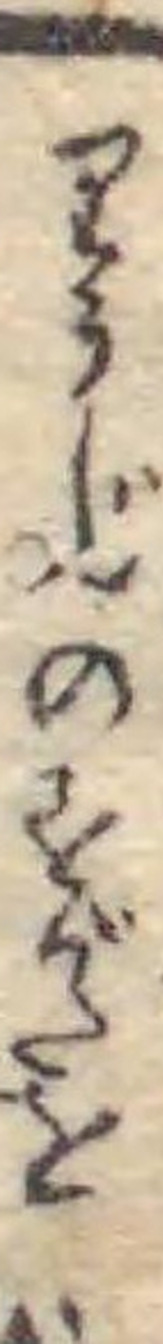りうじんのすがたを
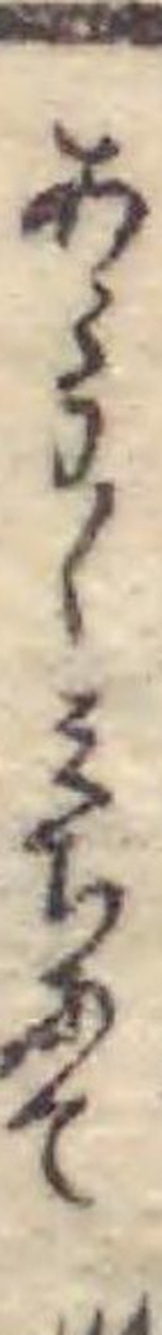あらわしみちにて
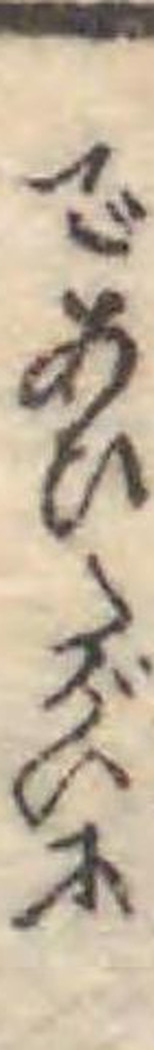であひたがいに
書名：鐘入七人化粧 : 3巻
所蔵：国立国会図書館 National Diet Library, JAPAN
